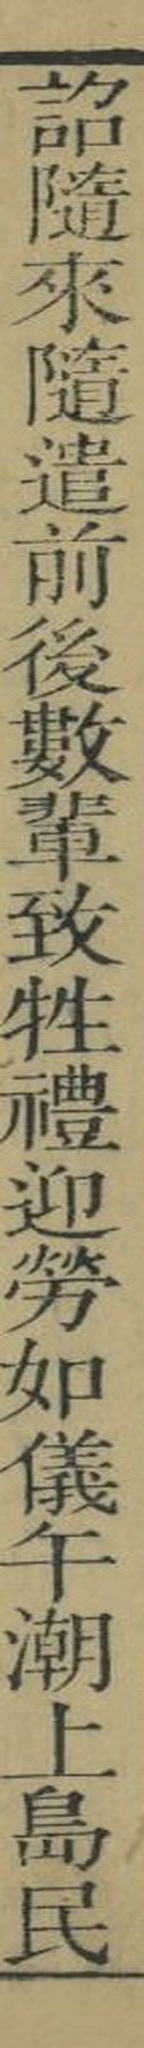詔隨來隨遣前後數輩致牲禮迎勞如儀午潮上島民
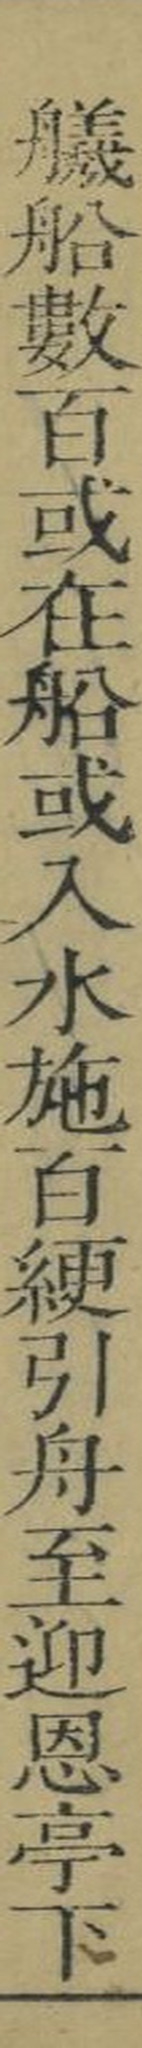艤船數百或在船或入水施百綆引舟至迎恩亭下

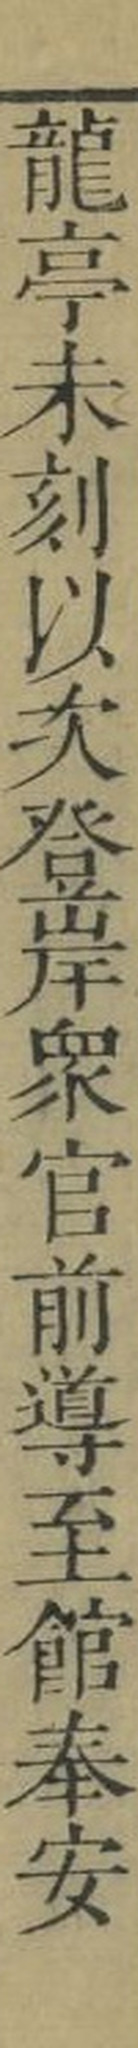龍亭未刻以次登岸衆官前導至館奉安
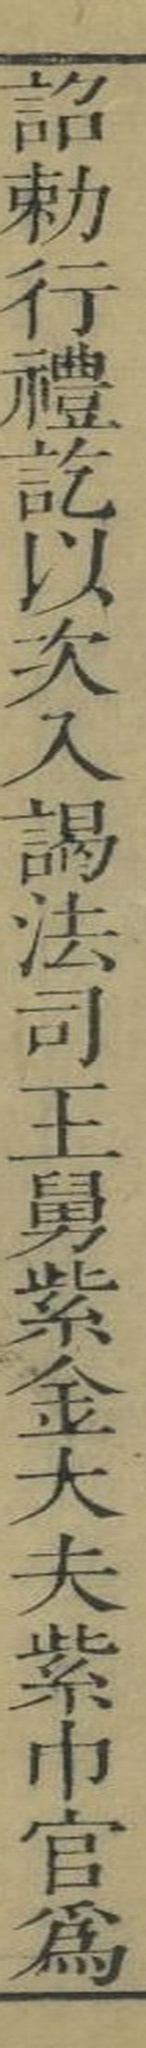詔勅行禮訖以次入謁法司王舅紫金大夫紫巾官爲
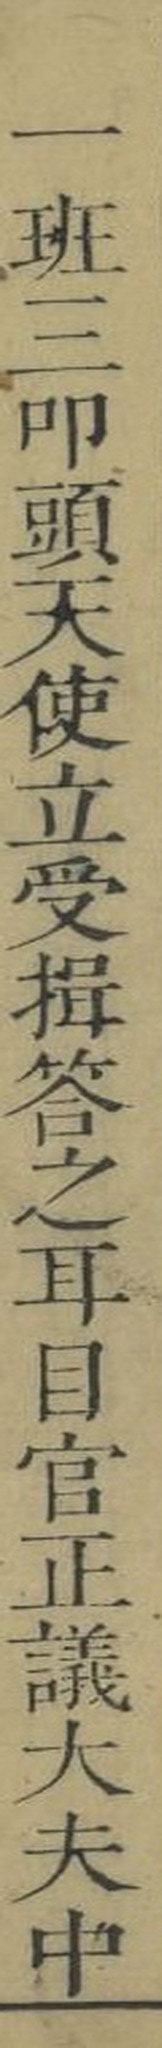一班三叩頭天使立受揖答之耳目官正議大夫中
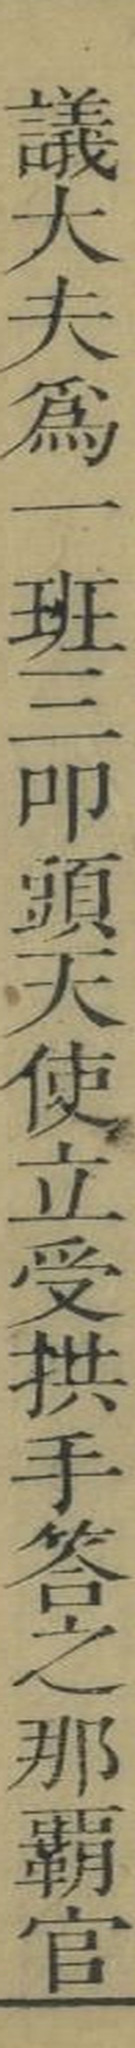議大夫爲一班三叩頭天使立受拱手答之那覇官
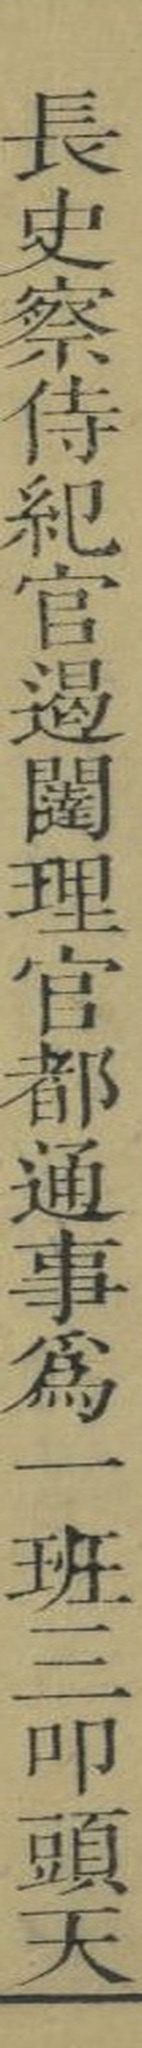長史察侍紀官遏闥理官都通事爲一班三叩頭天
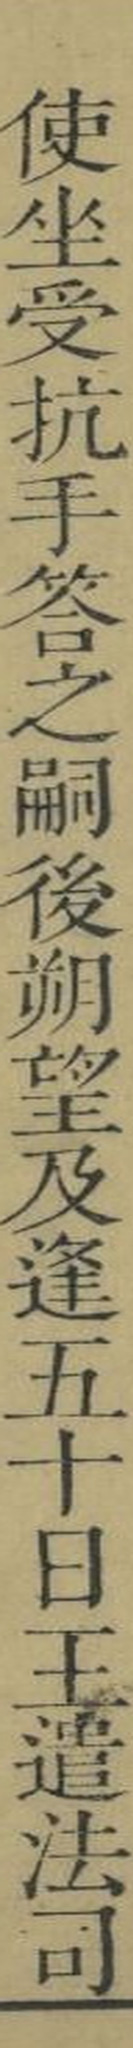使坐受抗手答之嗣後朔望及逢五十日王遣法司
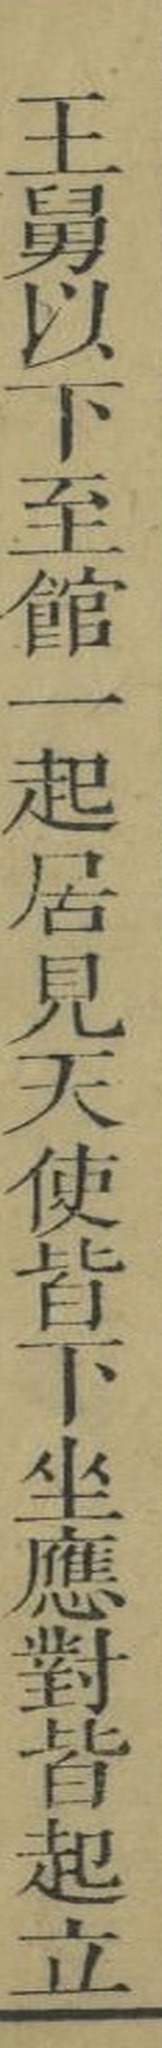王舅以下至館一起居見天使皆下坐應對皆起立
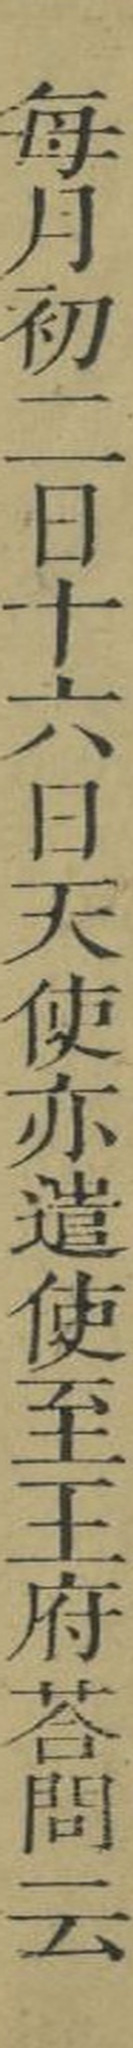每月初二日十六日天使亦遣使至王府荅問云

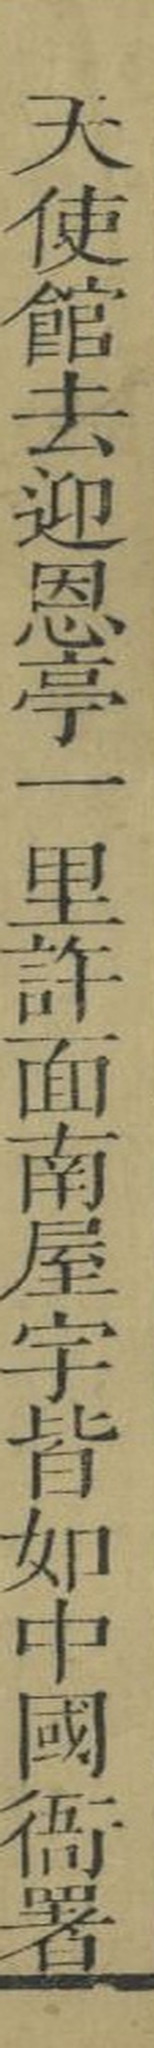天使館去迎恩亭一里許面南屋宇皆如中國衙署
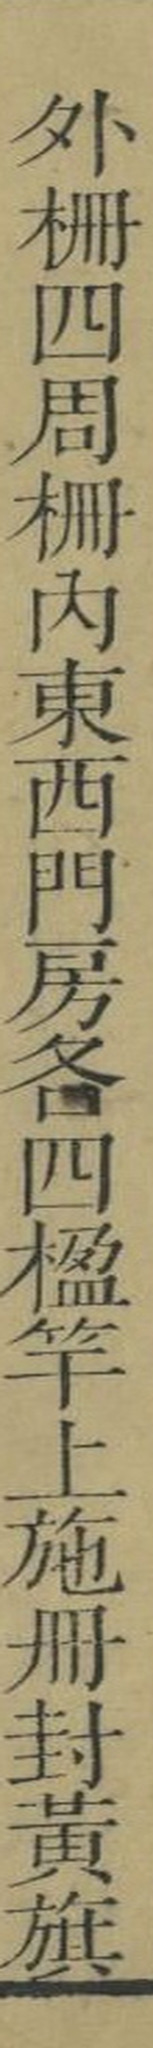外柵四周柵内東西門房各四楹竿上施冊封黃旗
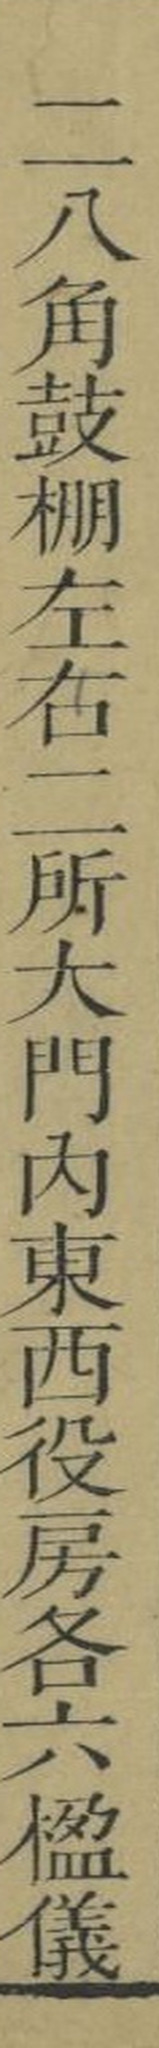二八角鼓棚左右二所大門内東西役房各六楹儀
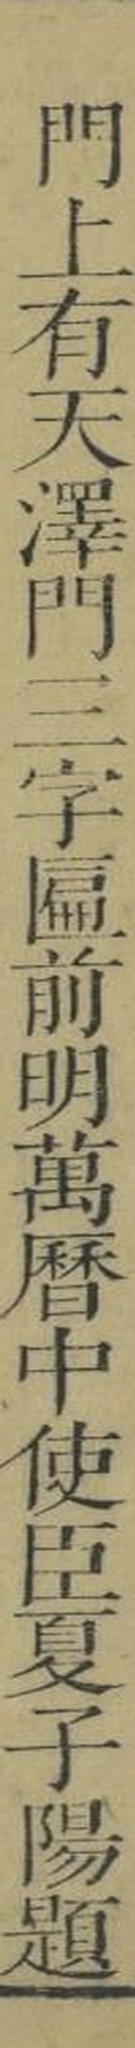門上有天澤門三字匾前明萬曆中使臣夏子陽題
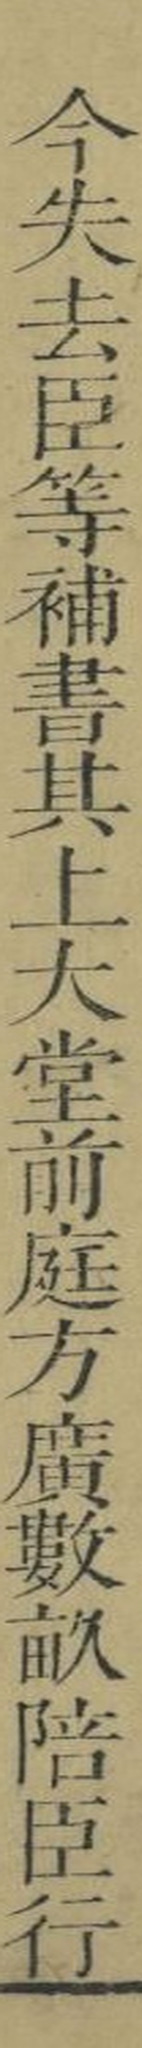今失去臣等補書其上大堂前庭方廣數畝陪臣行
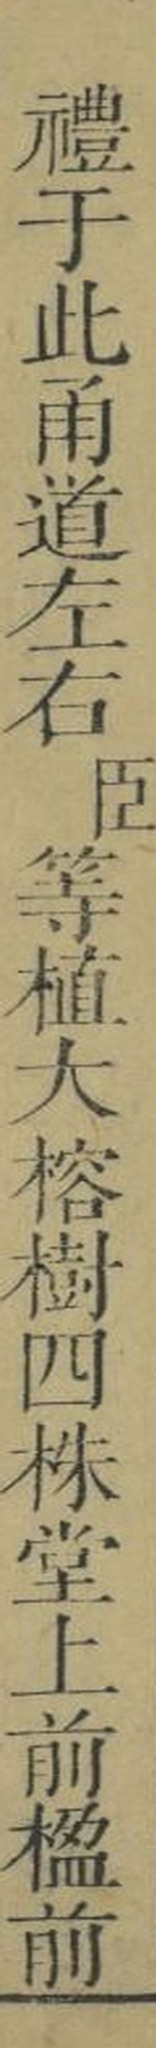禮于此甬道左右臣等植大榕樹四株堂上前楹前
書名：中山伝信録 巻二
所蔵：University of the Ryukyus Library
